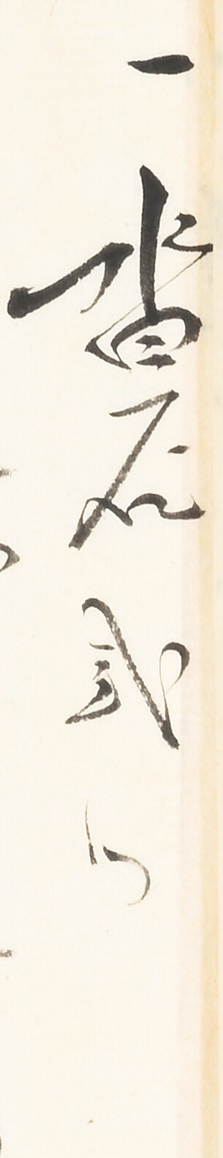一沓石弐ツ
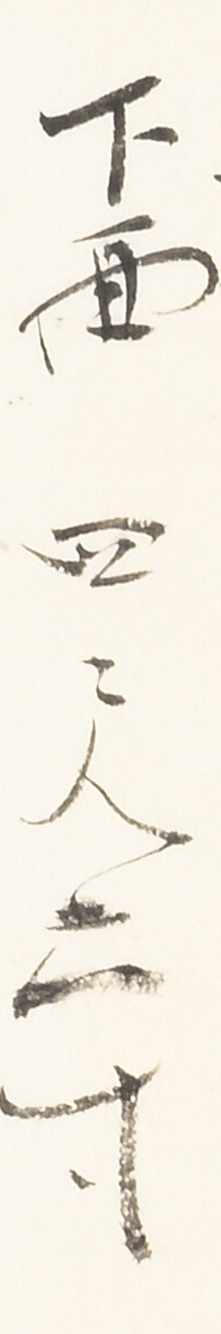下面四尺六寸
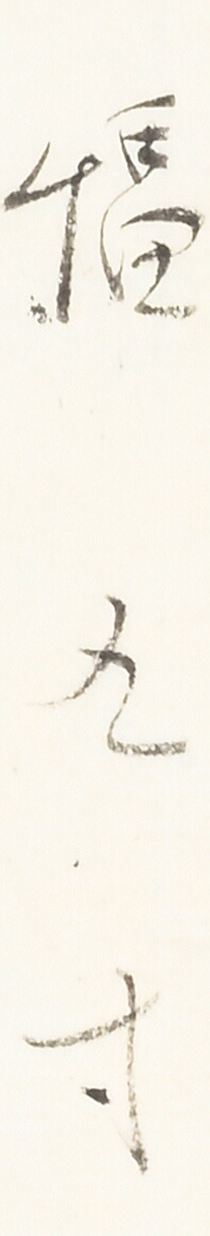幅九寸
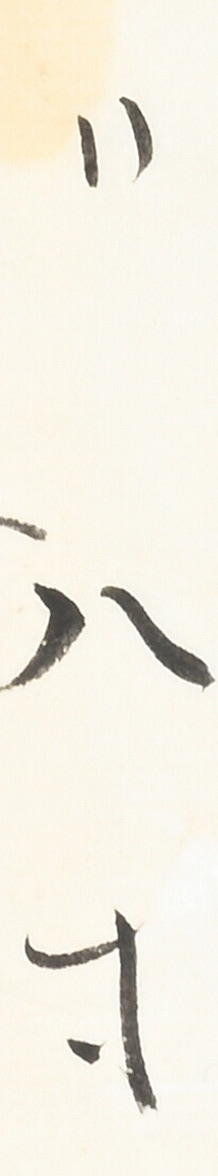〃八寸
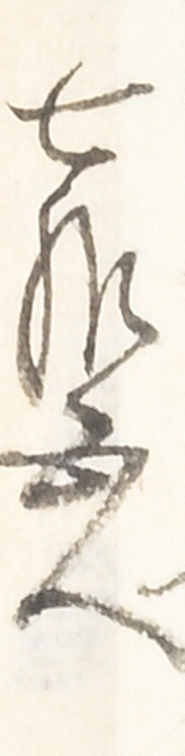七拾五人

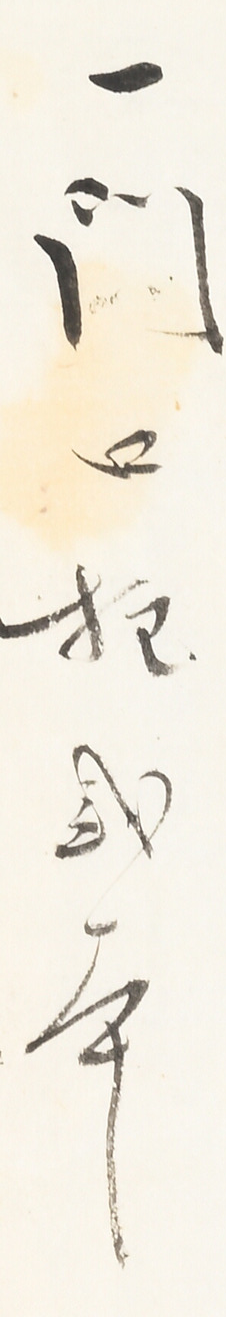一門口柱弐本
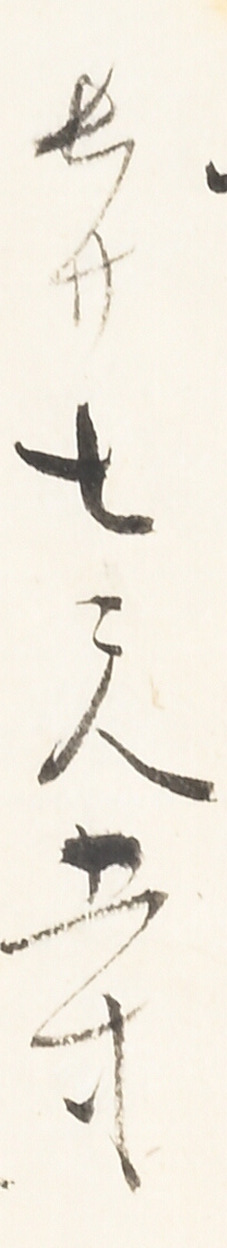長サ七尺五寸
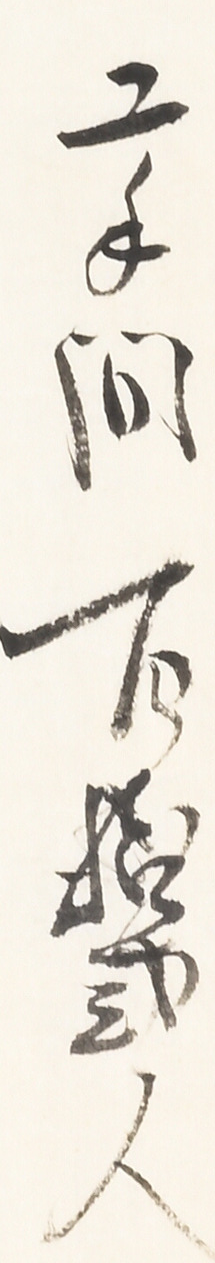工手間百拾弐人
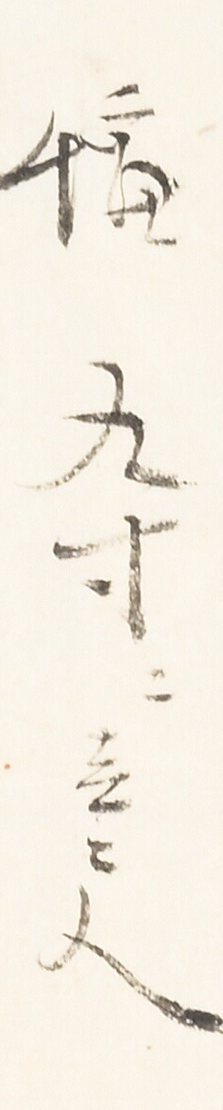幅九寸ニ壱尺
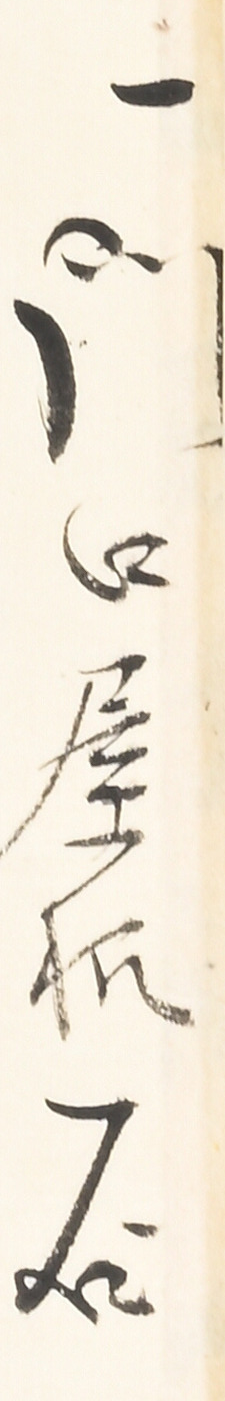一門口屋根石
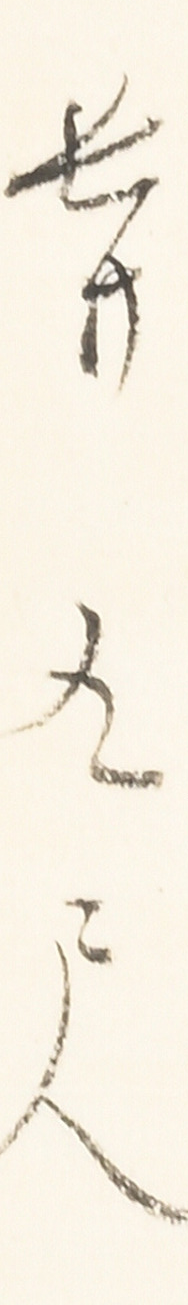長サ九尺
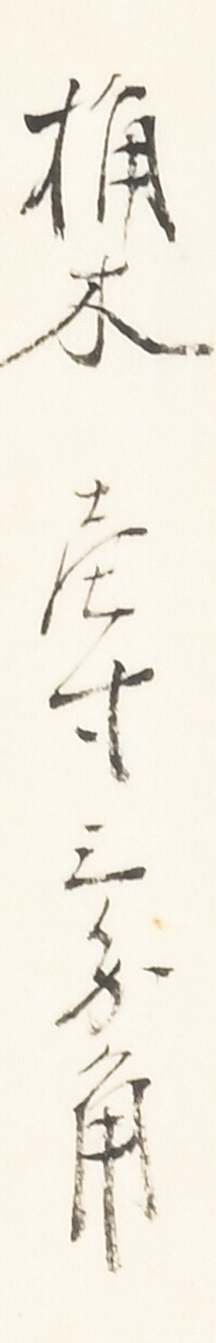桷木壱寸三分角
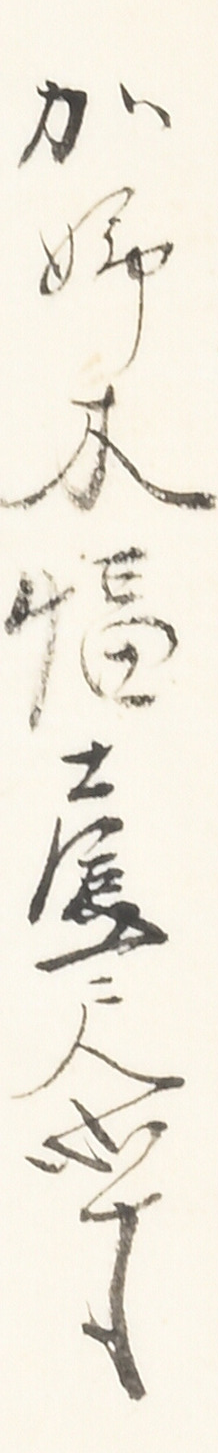かふ木幅壱尺弐寸
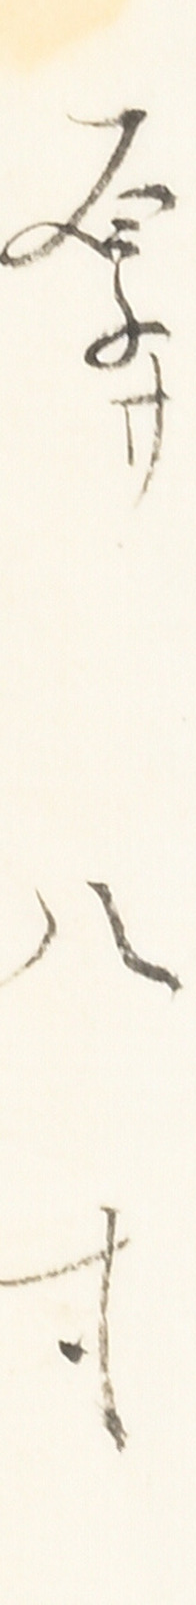厚サ八寸
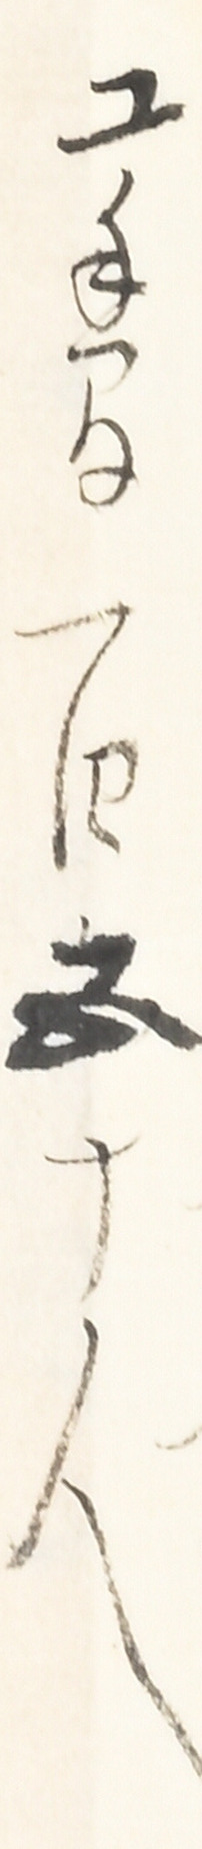工手間百五十人

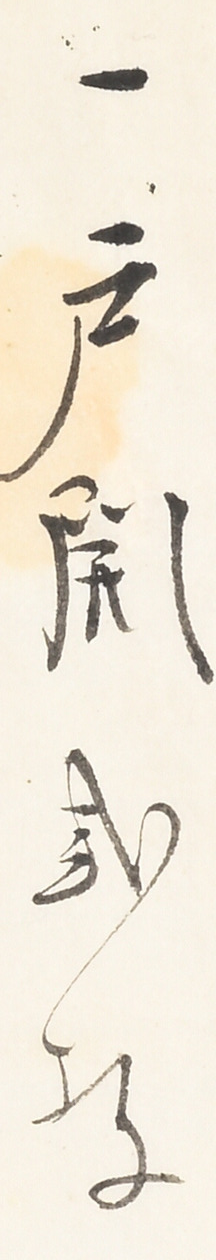一戸開弐枚
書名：天保十歳亥六月日玉垣御注文書上帳
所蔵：伊那市立高遠町図書館・合同会社AMANE
